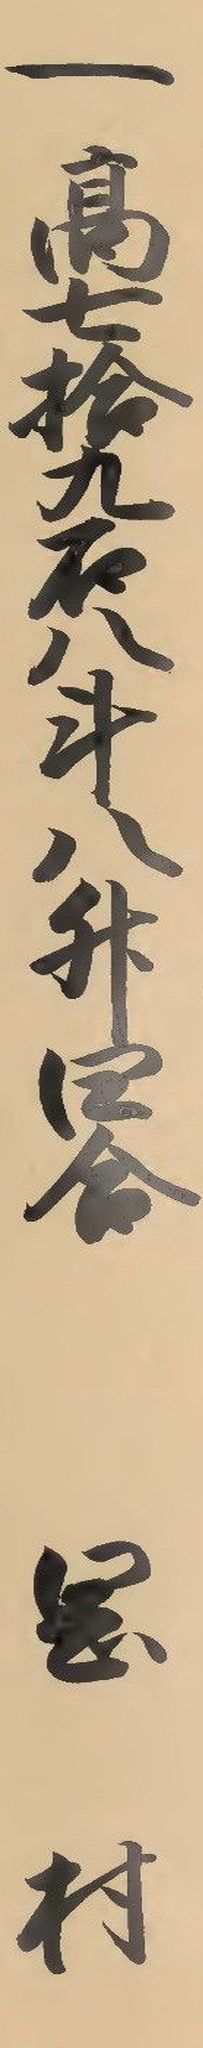一高七拾九石八斗八升四合岡村
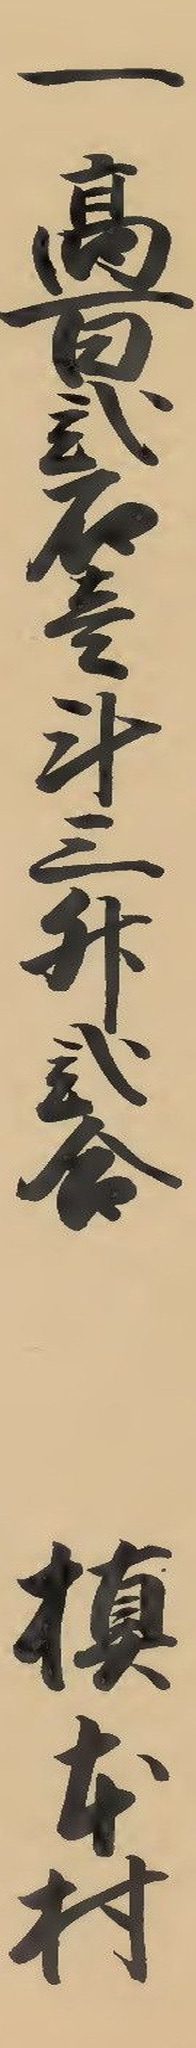一高百弐石壱斗三升弐合槙本村
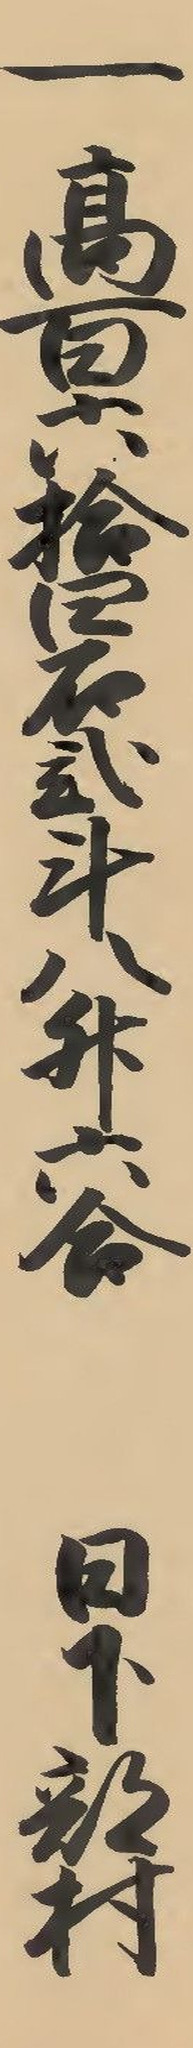一高百六拾四石弐斗八升六合日下部村
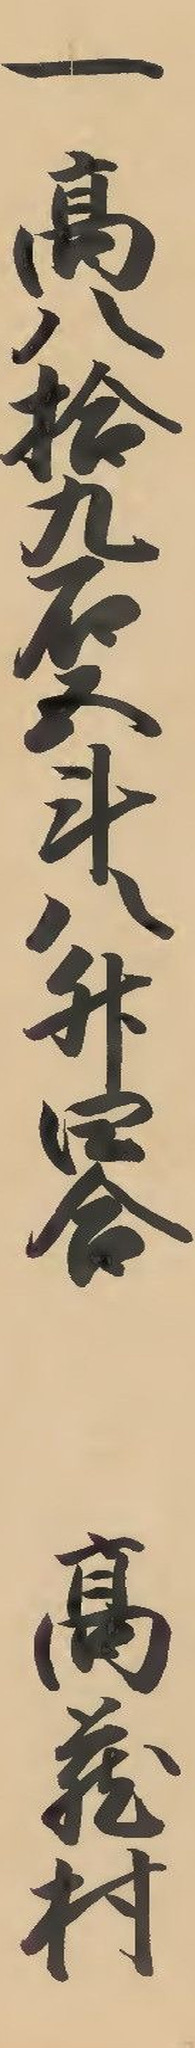一高八拾九石五斗八升四合高蔵村

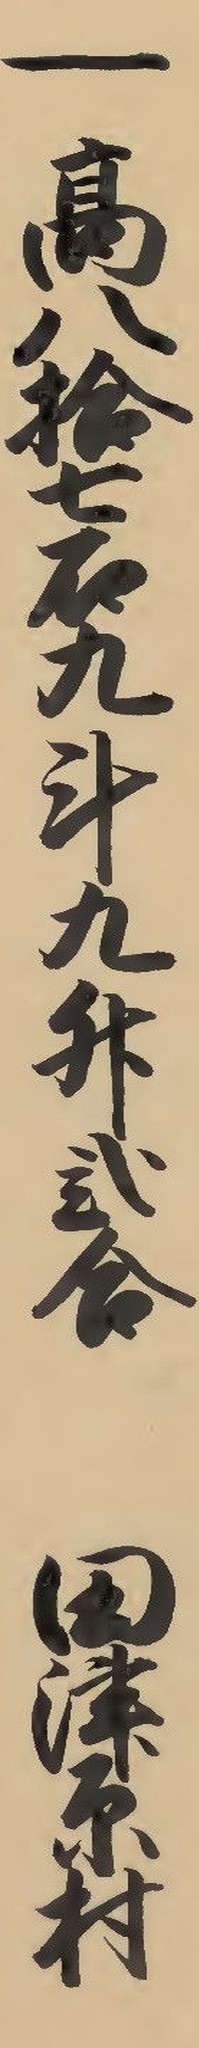一高八拾七石九斗九升弐合田津原村
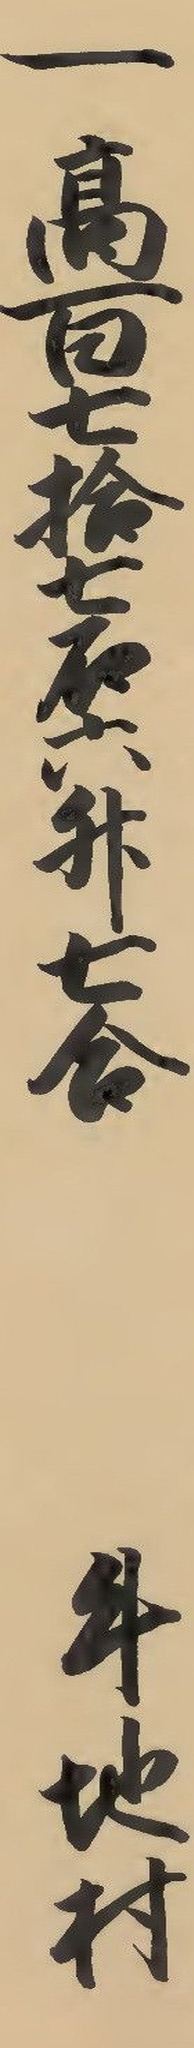一高百七拾七石六升七合牛地村
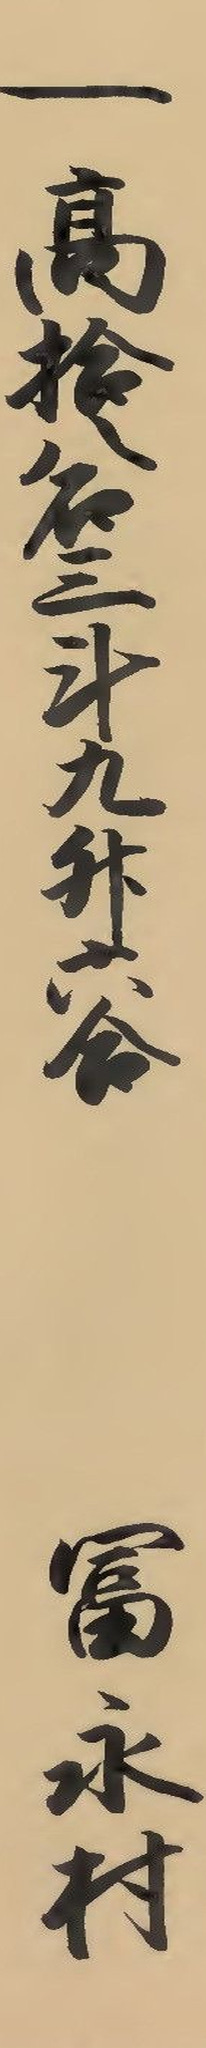一高拾八石三斗九升六合富永村
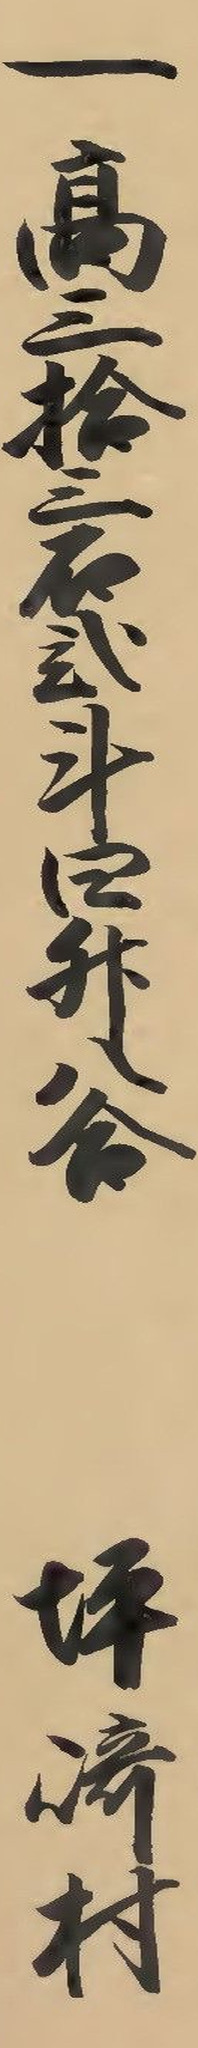一高三拾三石弐斗四升八合坪崎村
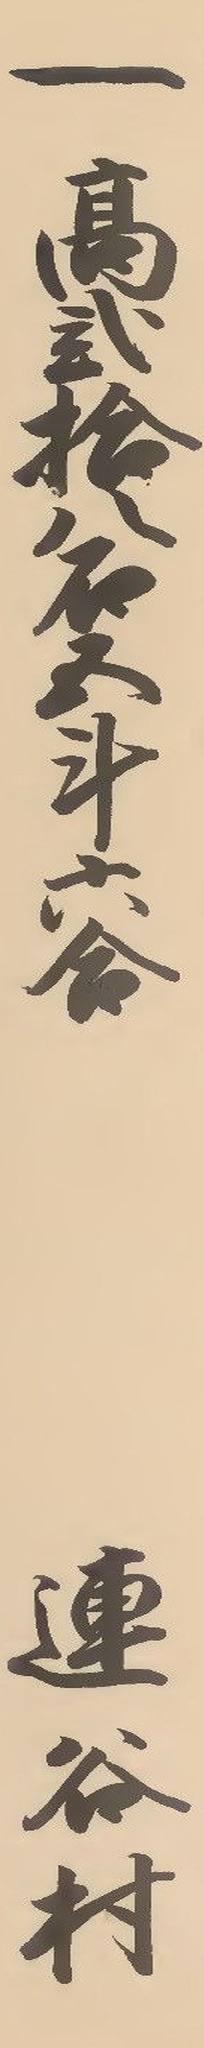一高弐拾八石五斗六合連谷村
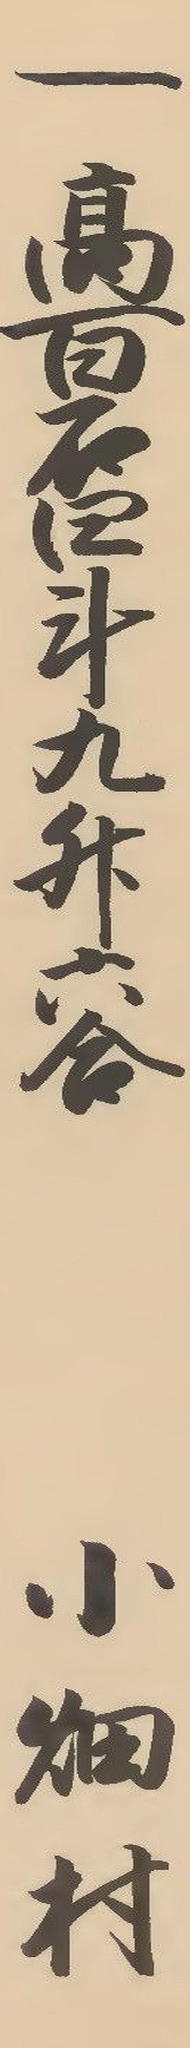一高百石四斗九升六合小畑村
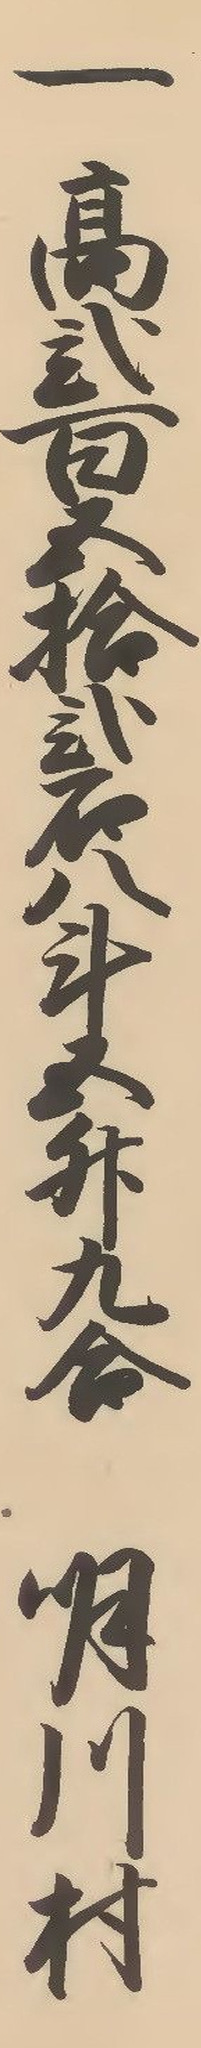一高弐百五拾弐石八斗五升九合明川村
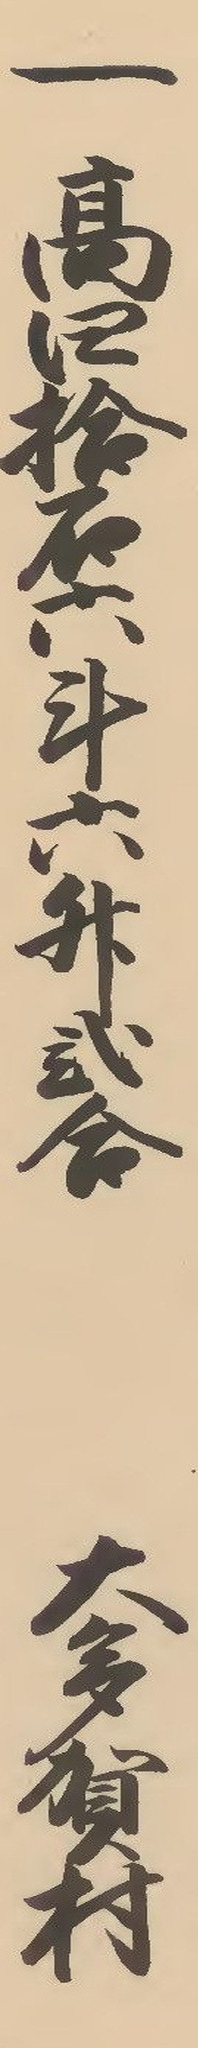一高四拾石六斗六升弐合大多賀村

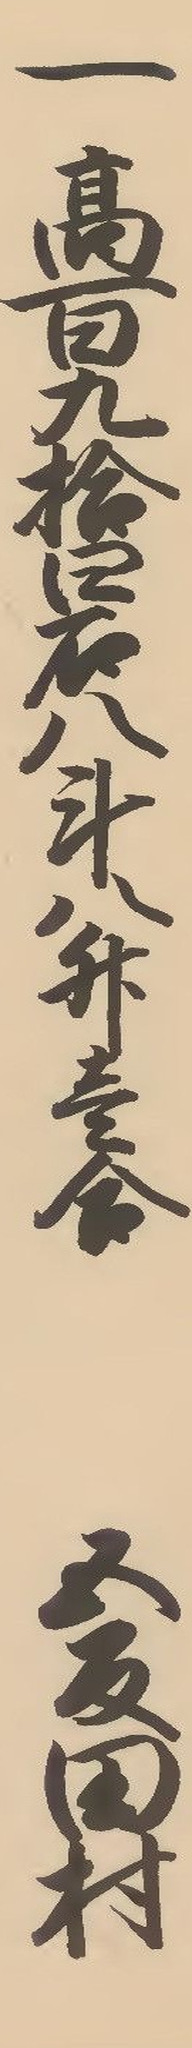一高百九拾四石八斗八升壱合五反田村
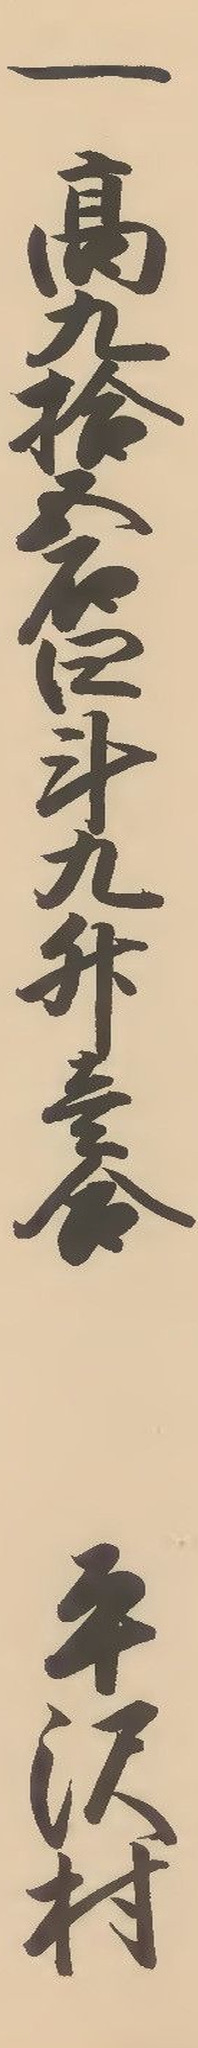一高九拾五石四斗九升壱合平沢村
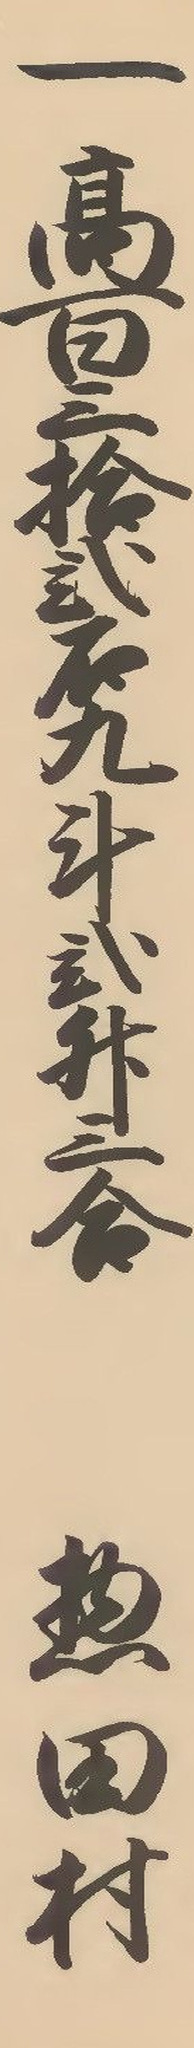一高百三拾弐石九斗弐升三合惣田村
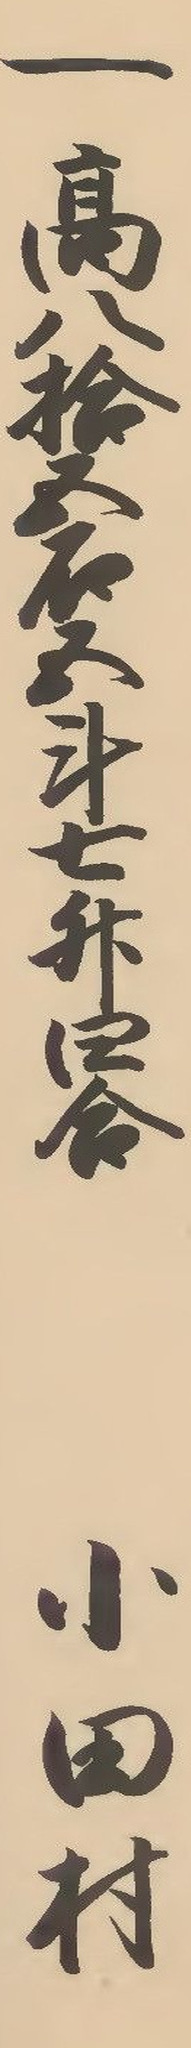一高八拾五石五斗七升四合小田村
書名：三河国郷帳
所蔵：国立公文書館 National Archives of Japan
